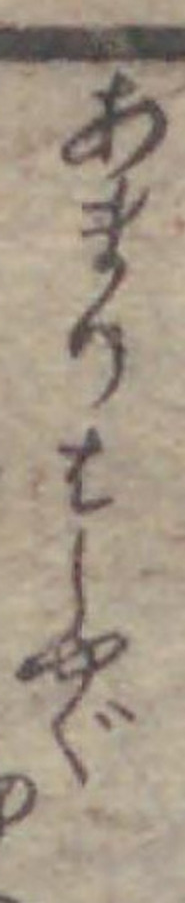あまりはしやぐ
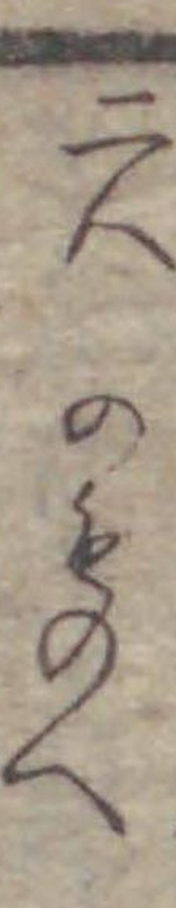二人のものへ
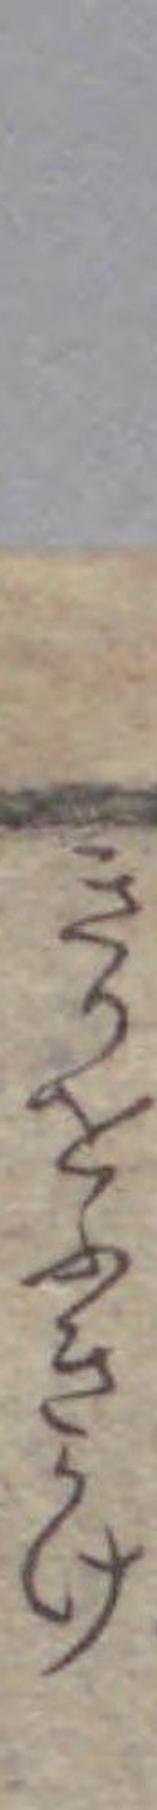きりをふきかけ
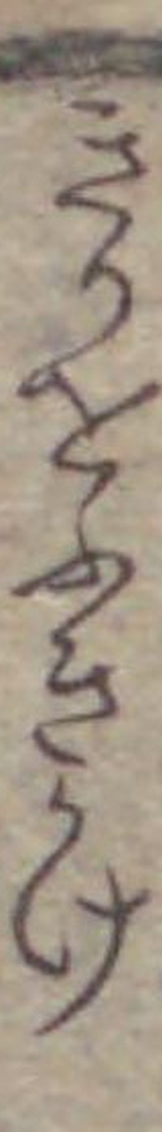きりをふきかけ
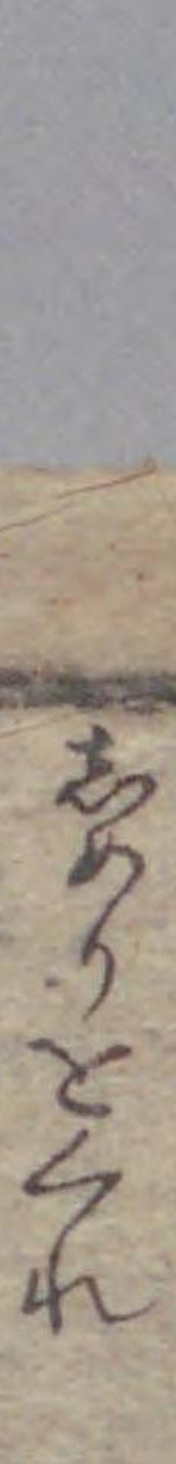しめりをくれ
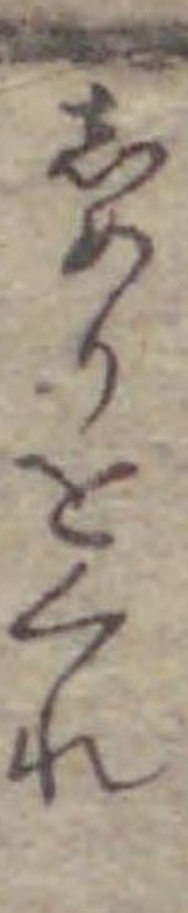しめりをくれ
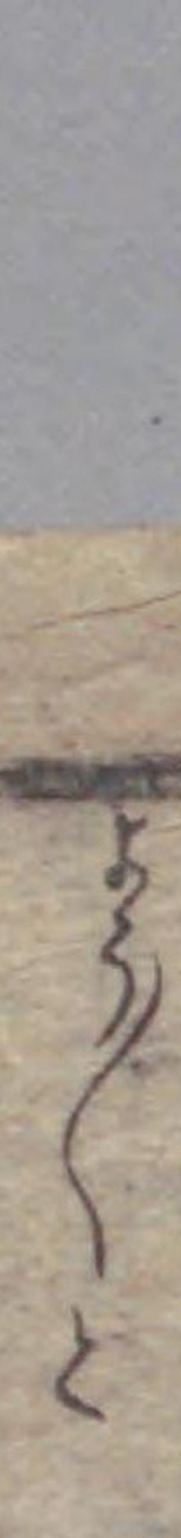よう〳〵と
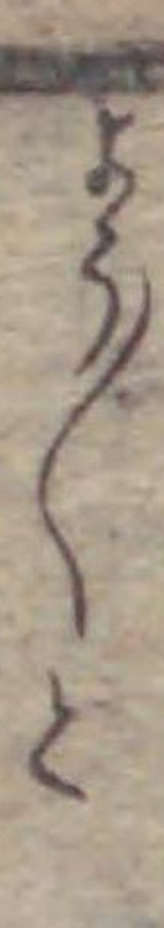よう〳〵と
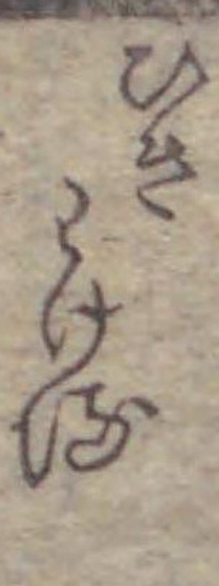わける

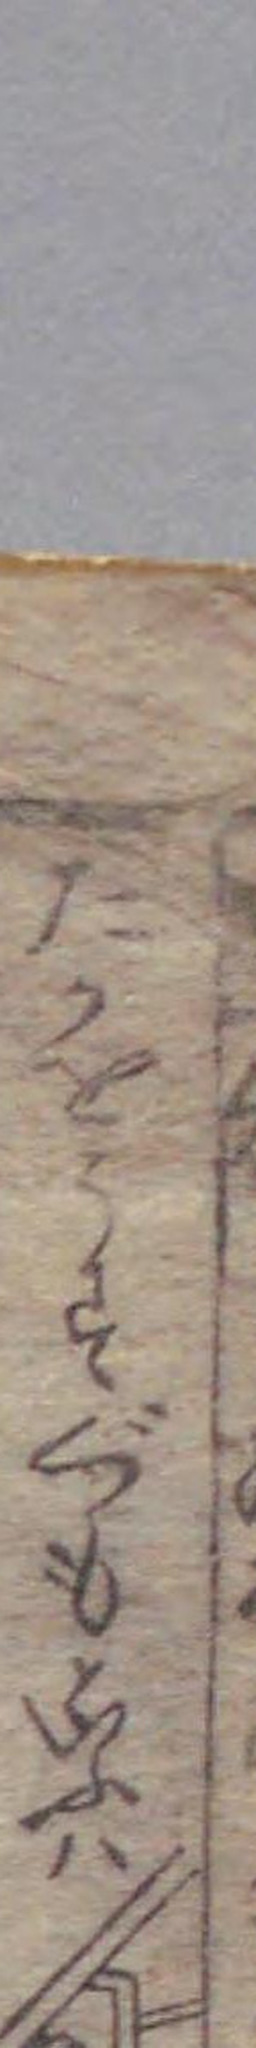たかをちすぐもといふは
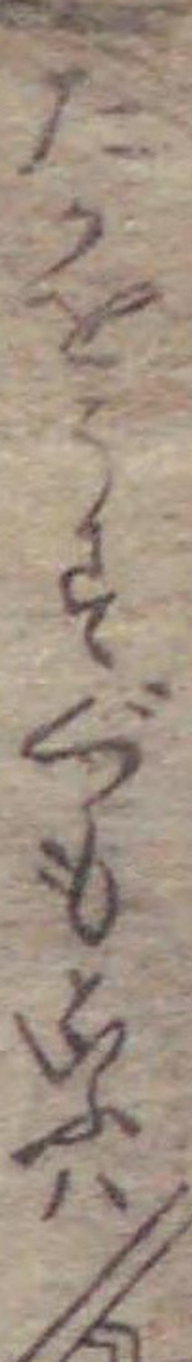たかをちすぐもといふは
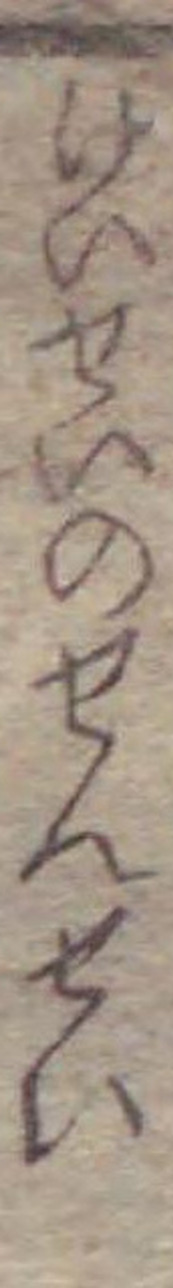けいせいのせんせい
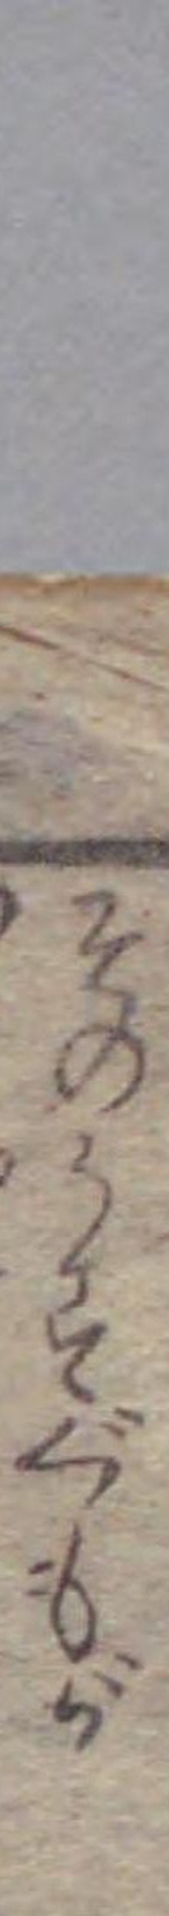そのうすぐもが
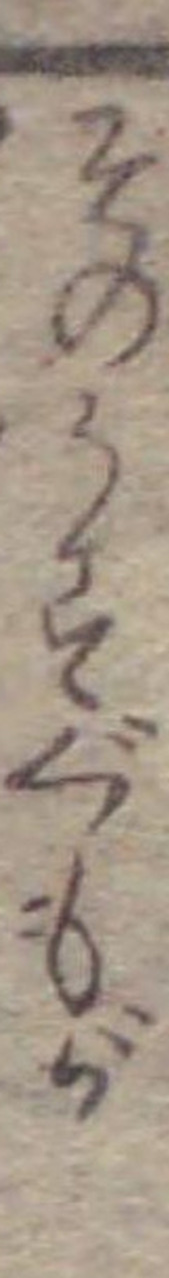そのうすぐもが
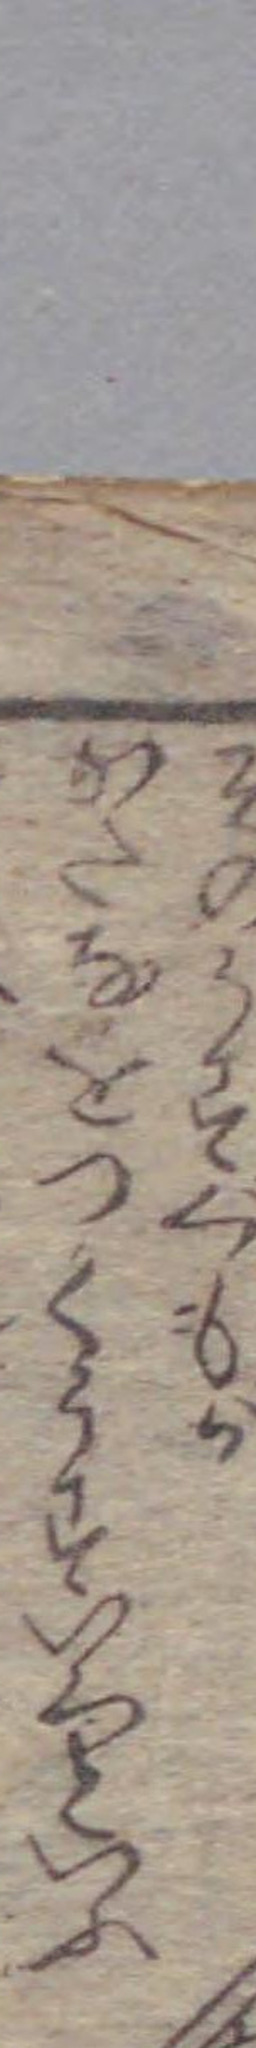かたなをつくらすいろといふ
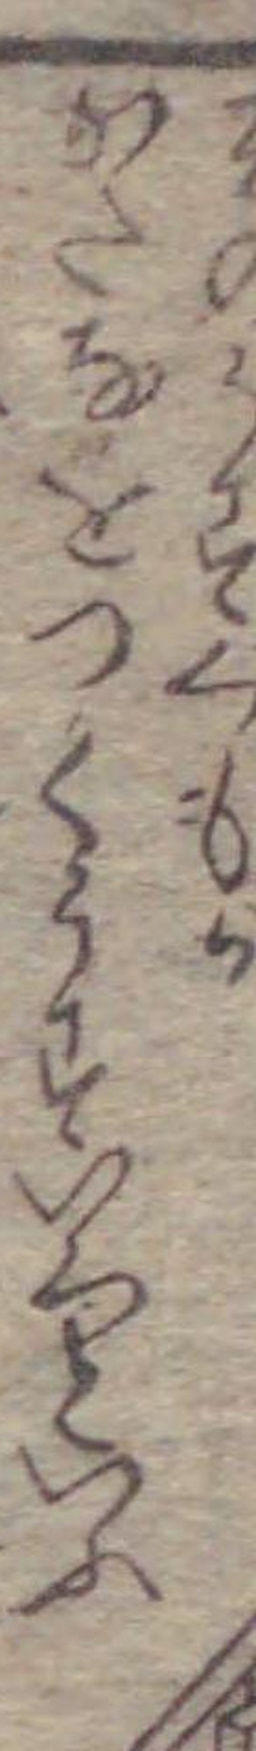かたなをつくらすいろといふ
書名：談芭菰誉詞 : 3巻
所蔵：国立国会図書館 National Diet Library, JAPAN
